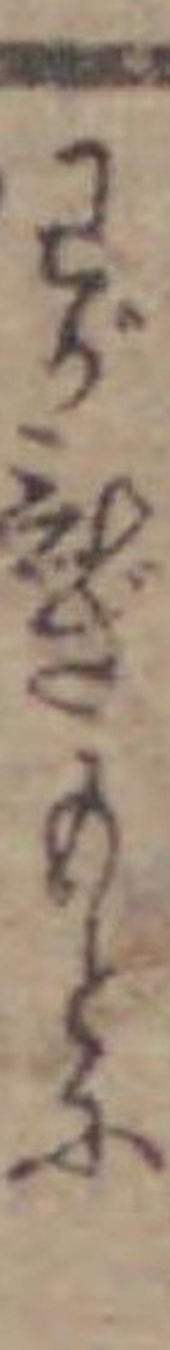わがひざもとに
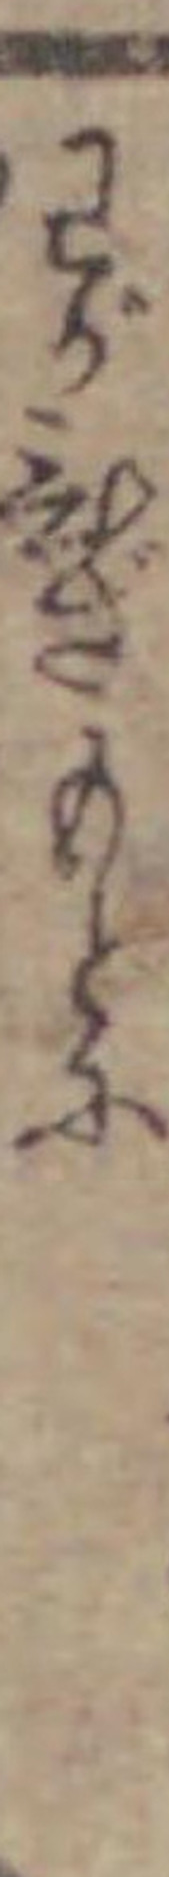わがひざもとに
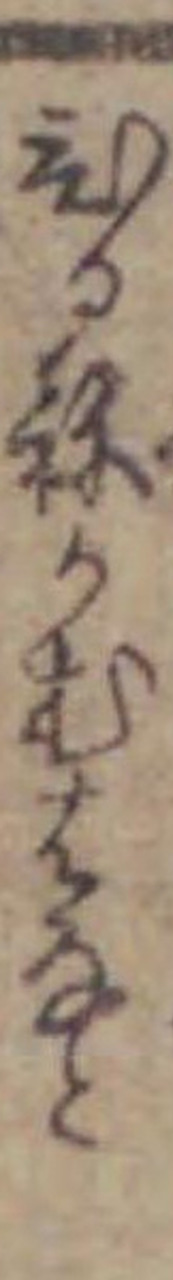ひるねかむはなと
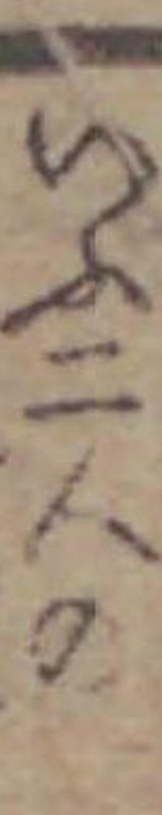いふ二人の
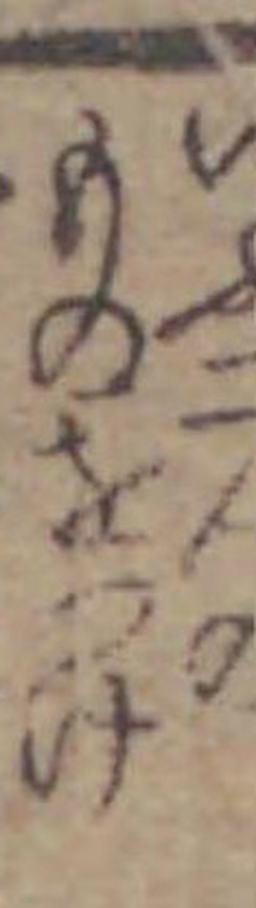ものをつけ
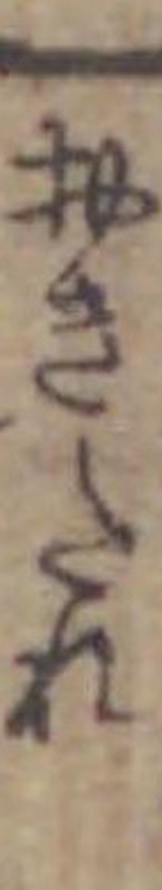おきたれ
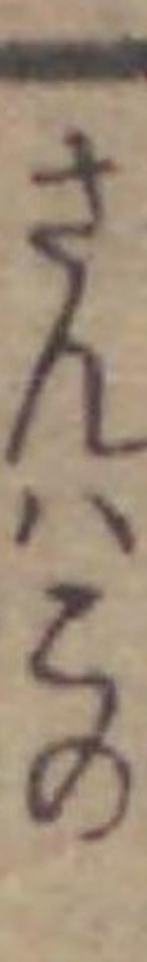さんはこの
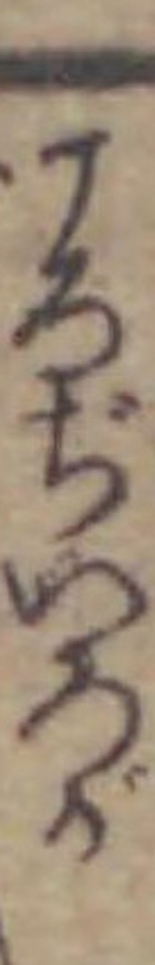ころぢいろが
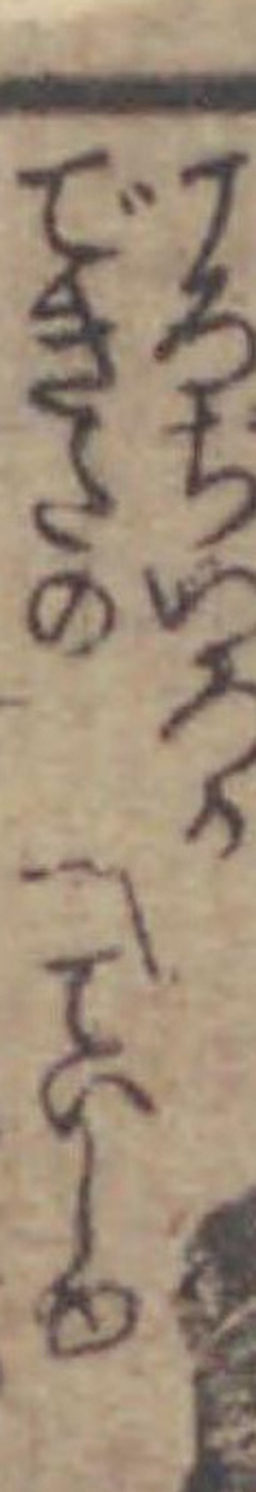できたの
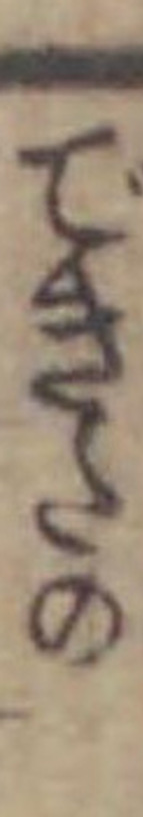できたの
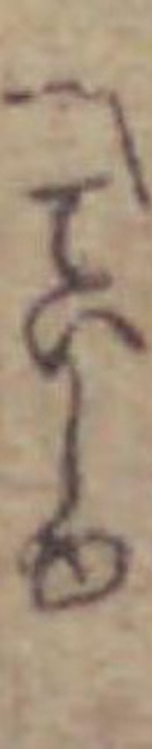「ていしゆ
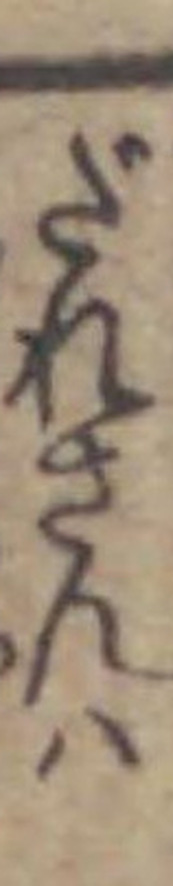だれさんは
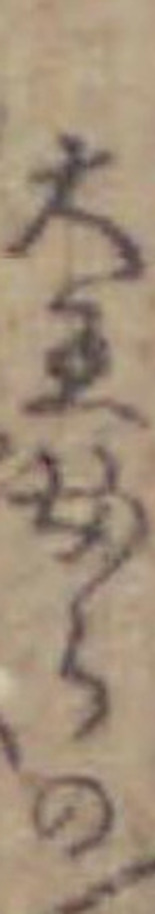大王女郎の
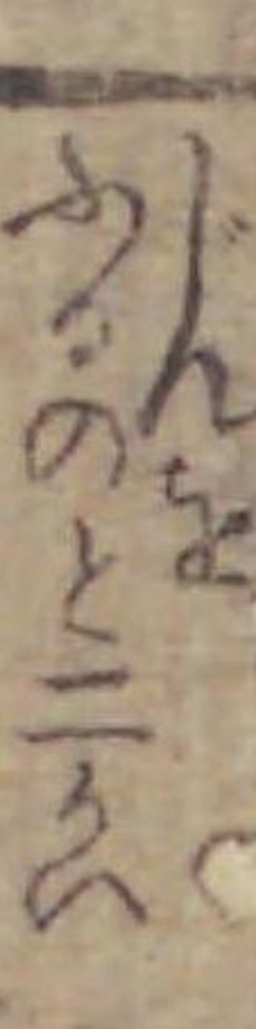ふるのと二かい
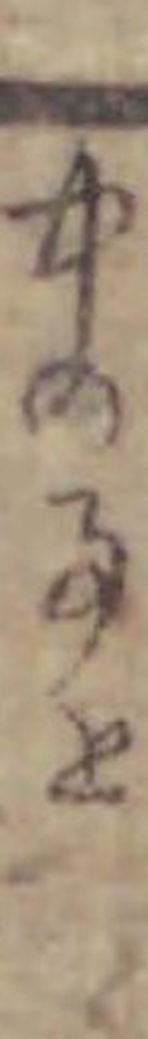中の事を
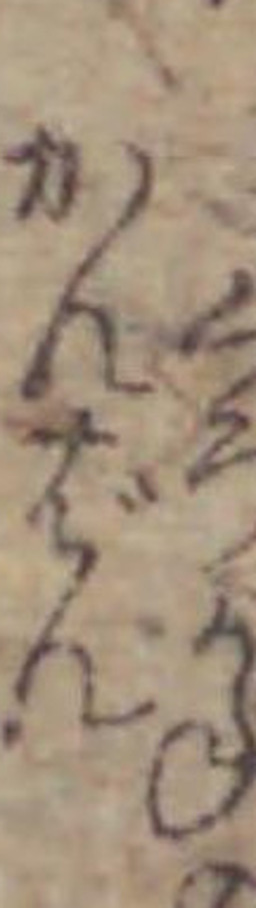かんばん
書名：九替十年色地獄 : 3巻
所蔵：国立国会図書館 National Diet Library, JAPAN
